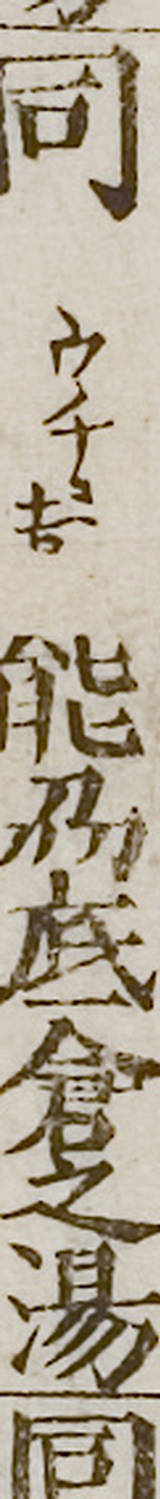同ウチミ吉能州底倉之湯
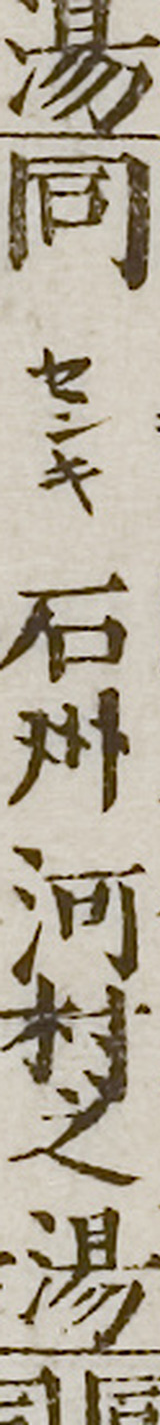同センキ石州河村之湯
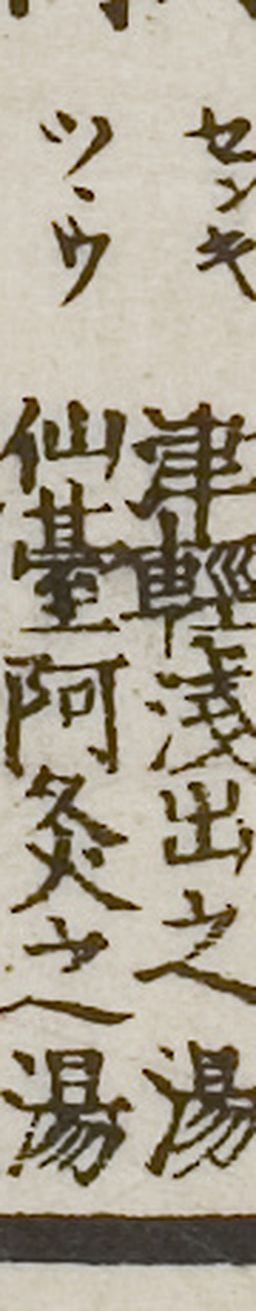同ツヽウ仙台阿灸之湯
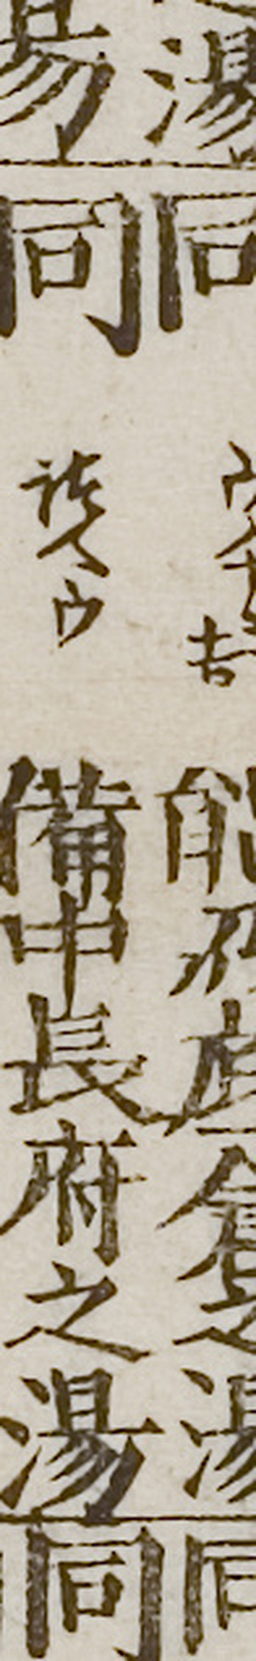同諸ヘウ備中長府之湯
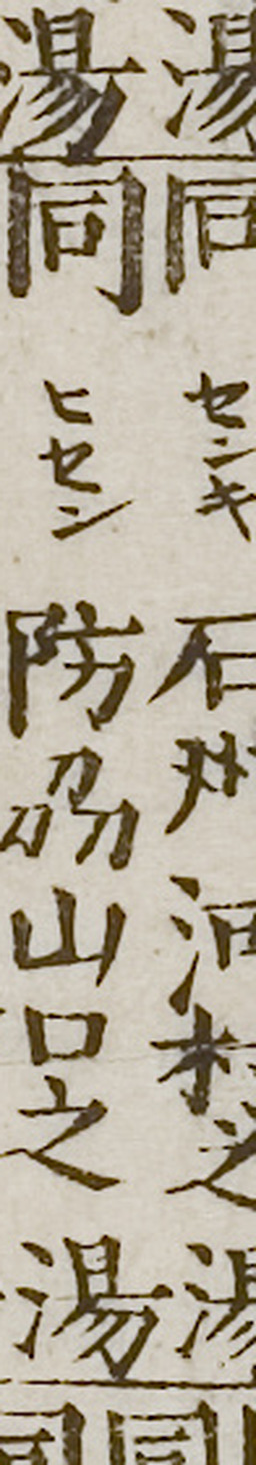同ヒセン防州山口之湯
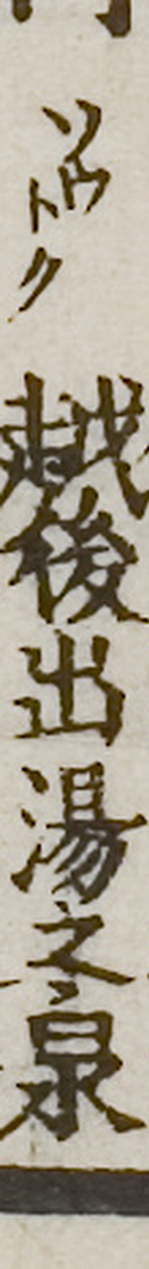同ソウトク越後出湯之泉
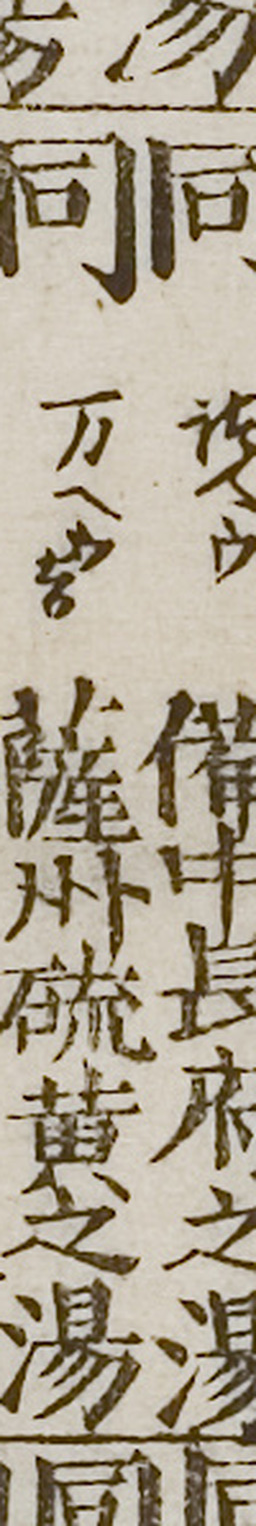同万ヘウ吉薩州硫黄之湯
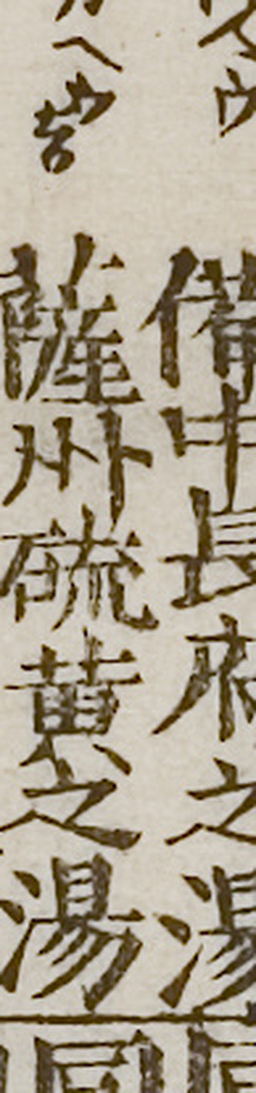前頭同薩州霧嶋之湯
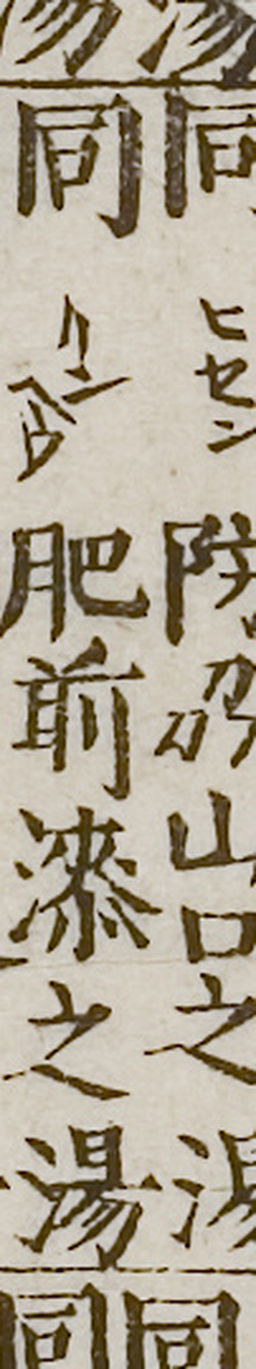同リンヘウ肥前漆之湯
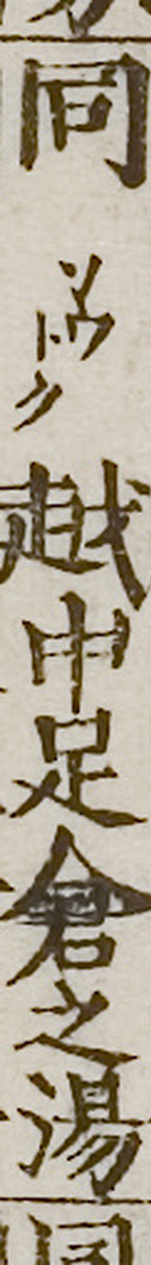同ソウトク越中足倉之湯
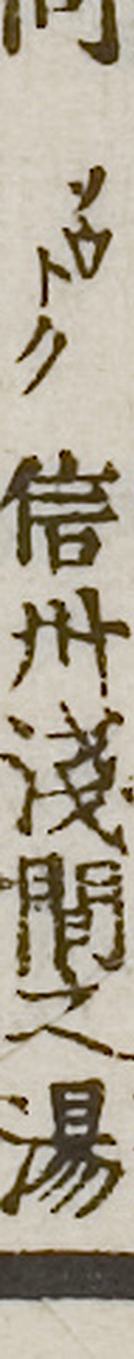同ソウトク信州浅間之湯
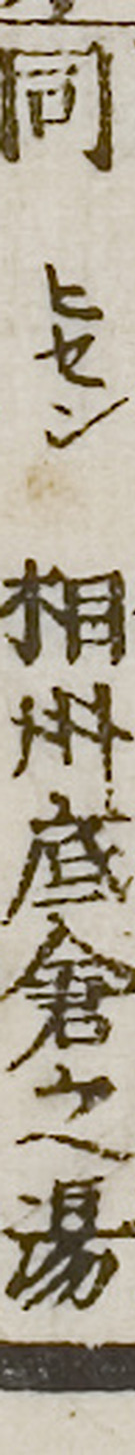同ヒセン相州底倉之湯
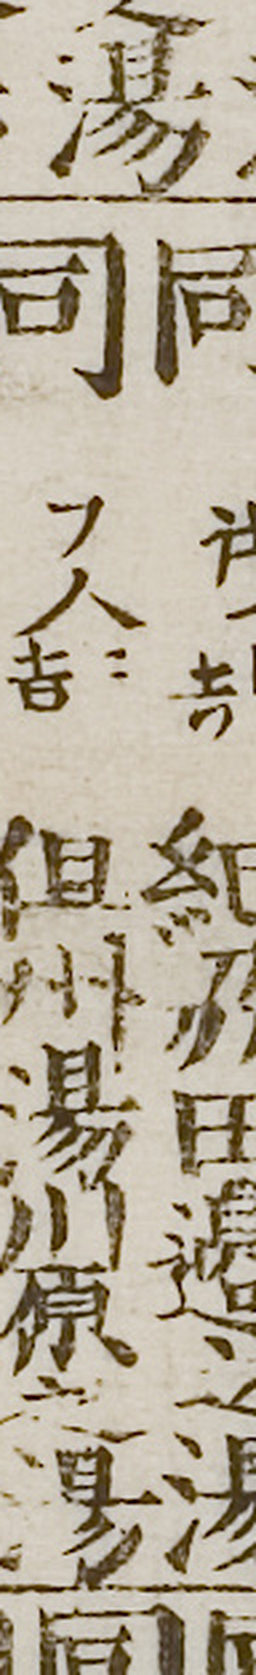同フ人ニ吉但州湯川原之湯
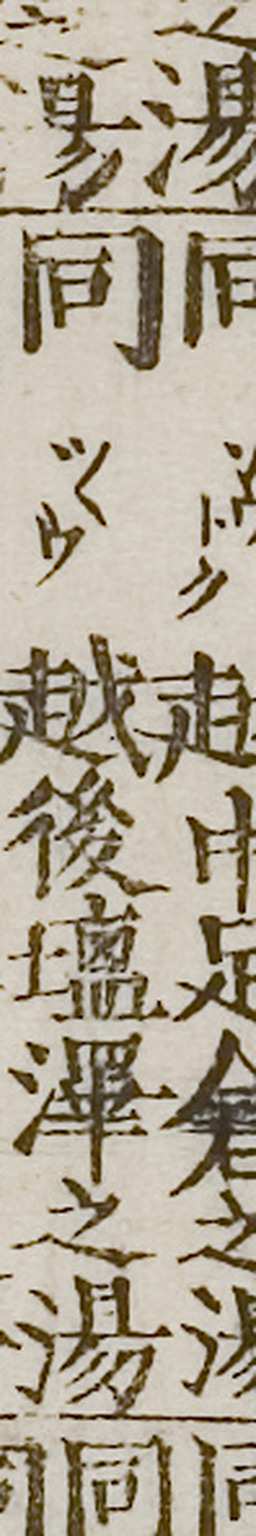同ツヽウ越後塩沢之湯
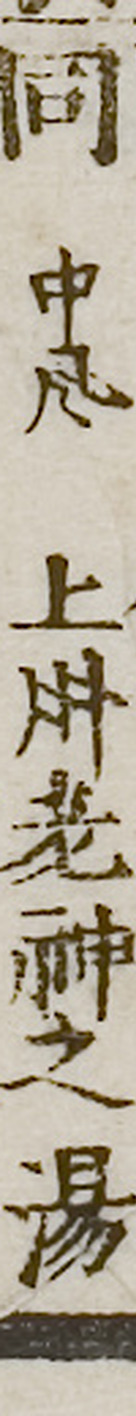同中風上州老神之湯
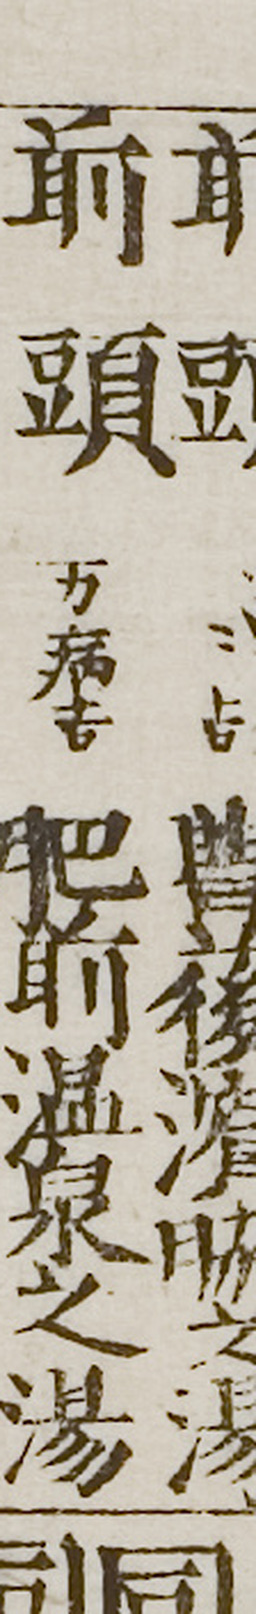前頭万病吉肥前温泉之湯
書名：諸国温泉一覧
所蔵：東京大学総合図書館 General Library in the University of Tokyo, JAPAN
